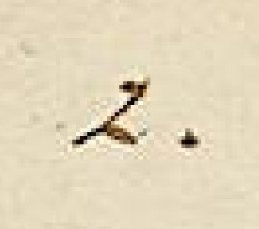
2.
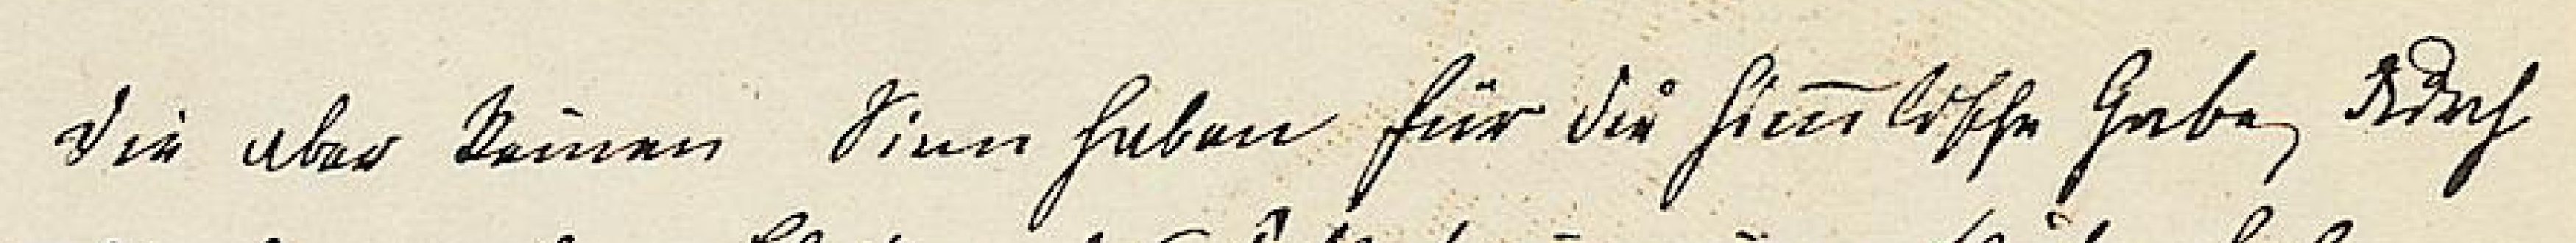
die aber keinen Sinn haben für die himlischen Gabe, durch
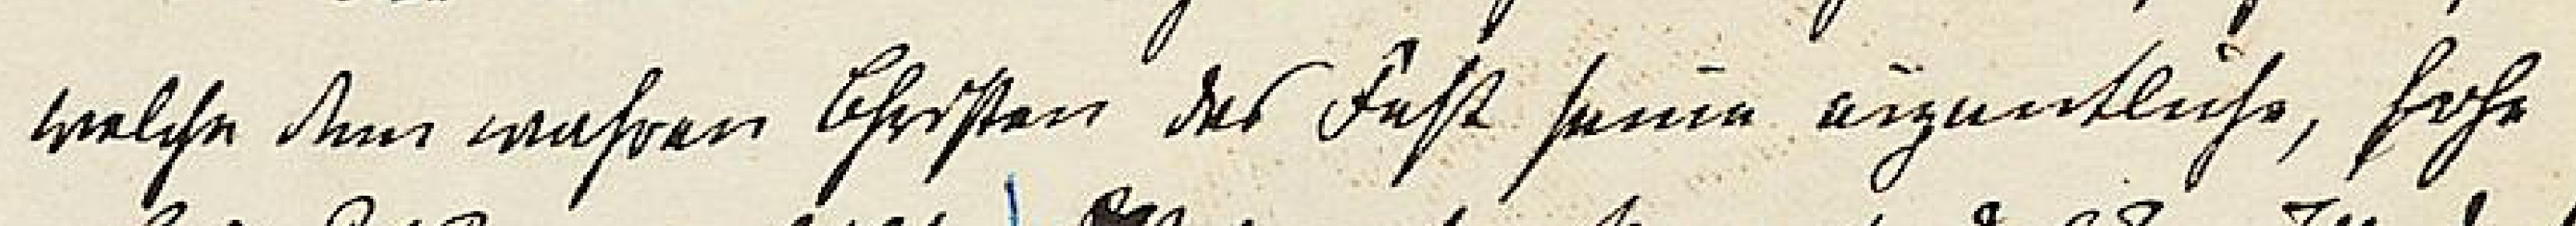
welche dem wahren Christen, das Fest seine eigentlche, hohe
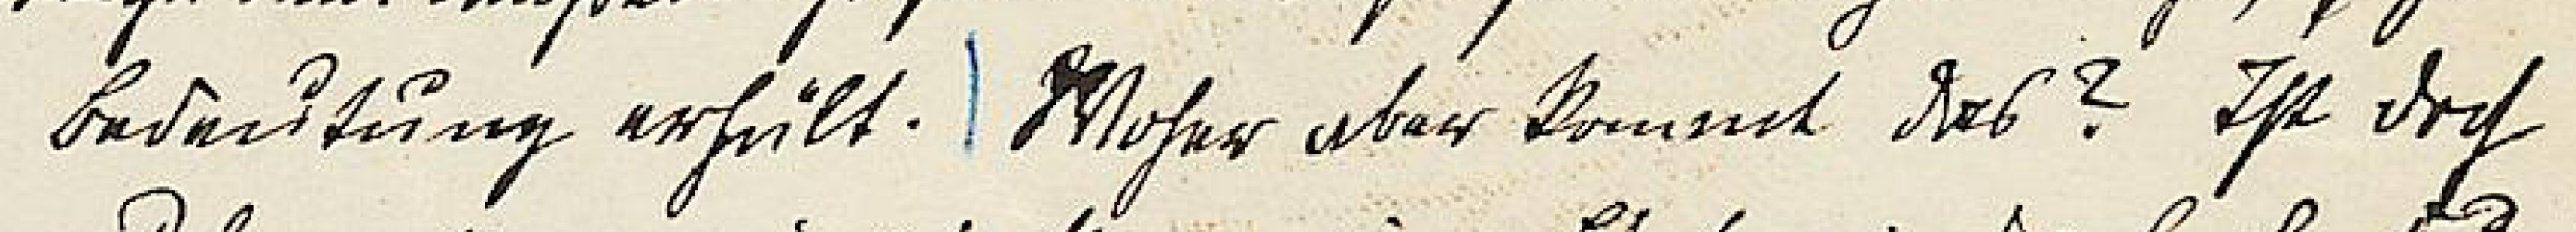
Bedeutung erhält. Woher aber kommt das? Ist doch
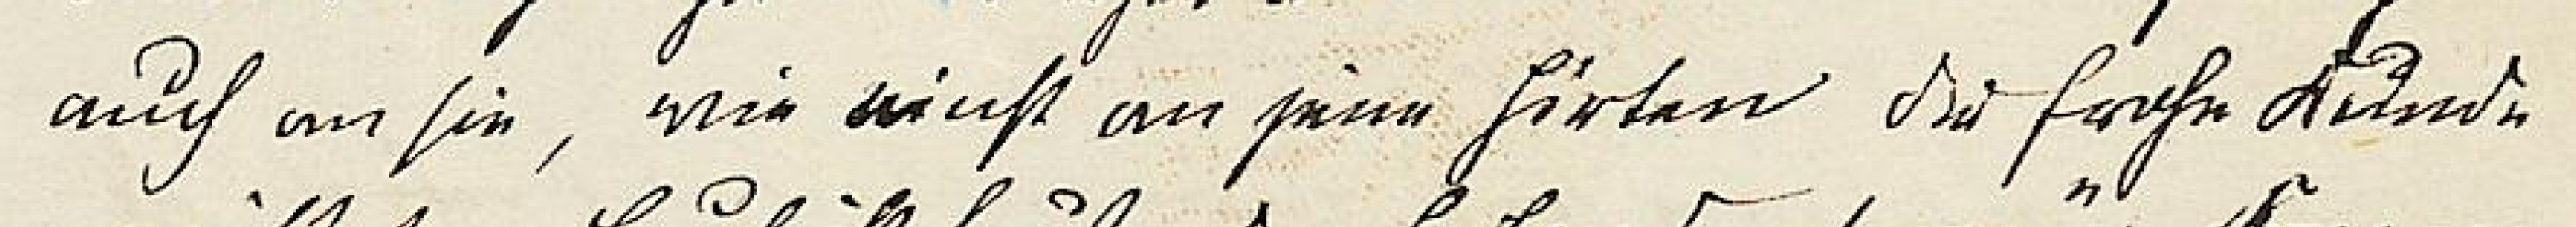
auch an sie, wie einst an jene Hirten die frohe Kunde
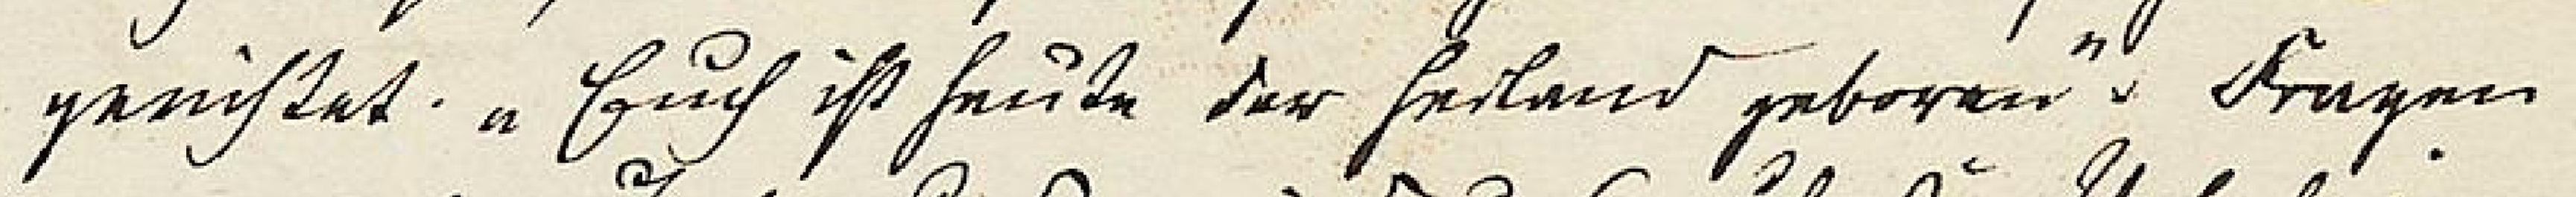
gerichtet "Euch ist heute der Heiland geboren". Fragen
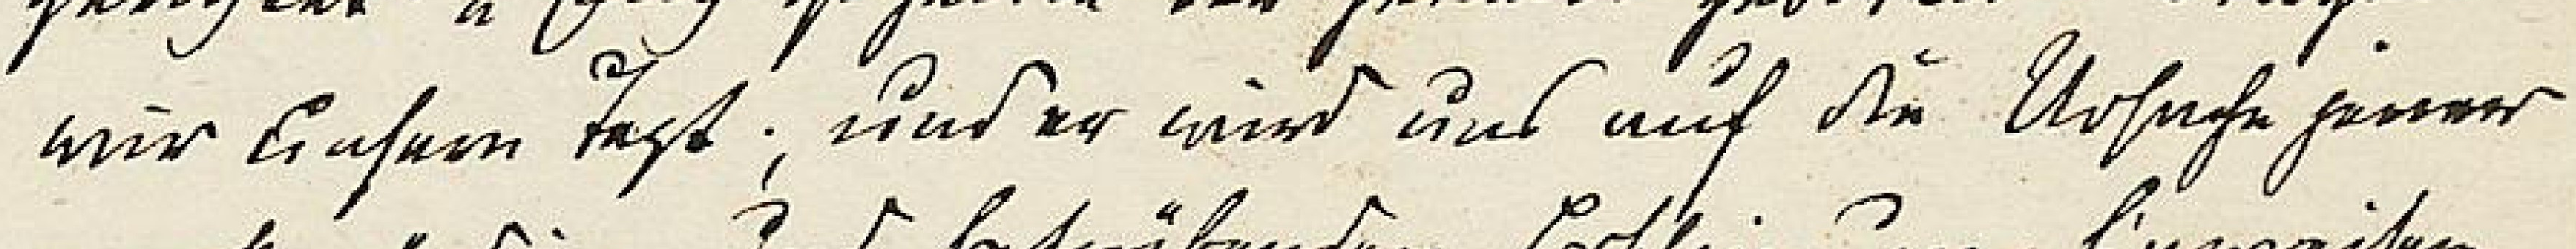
wir unsern Text; und er wird uns auf die Ursache jener
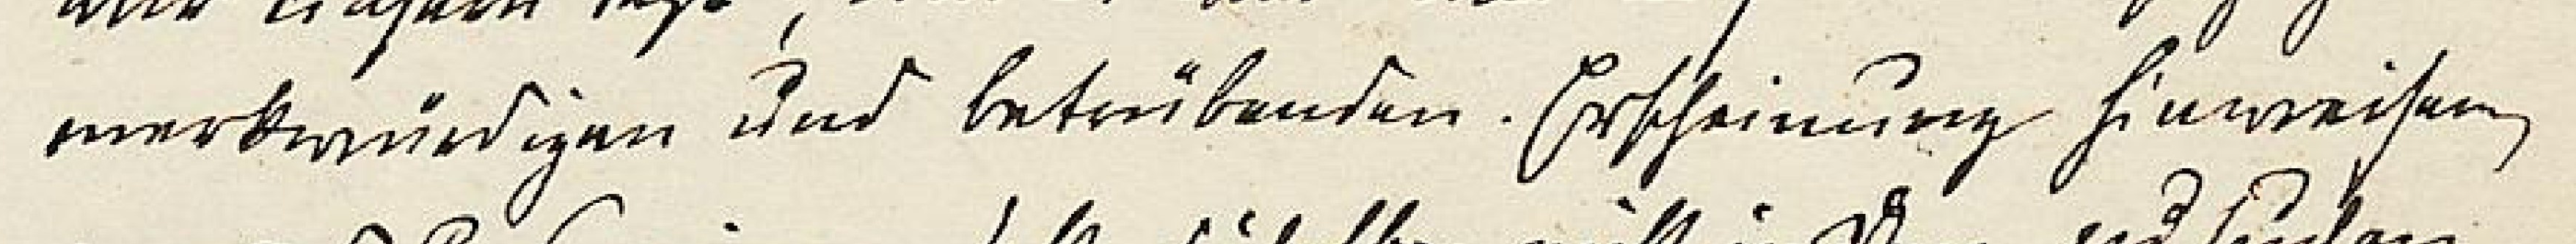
merkwürdigen und betrübenden Erscheinung hinweisen,
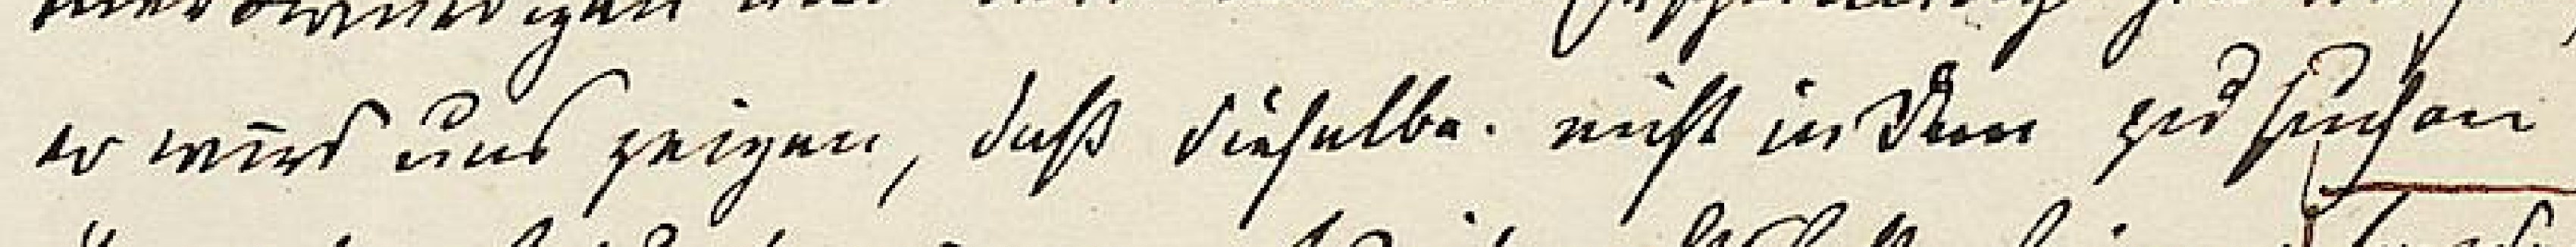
er wird uns zeigen, daß dieselbe nicht in dem zu suchen
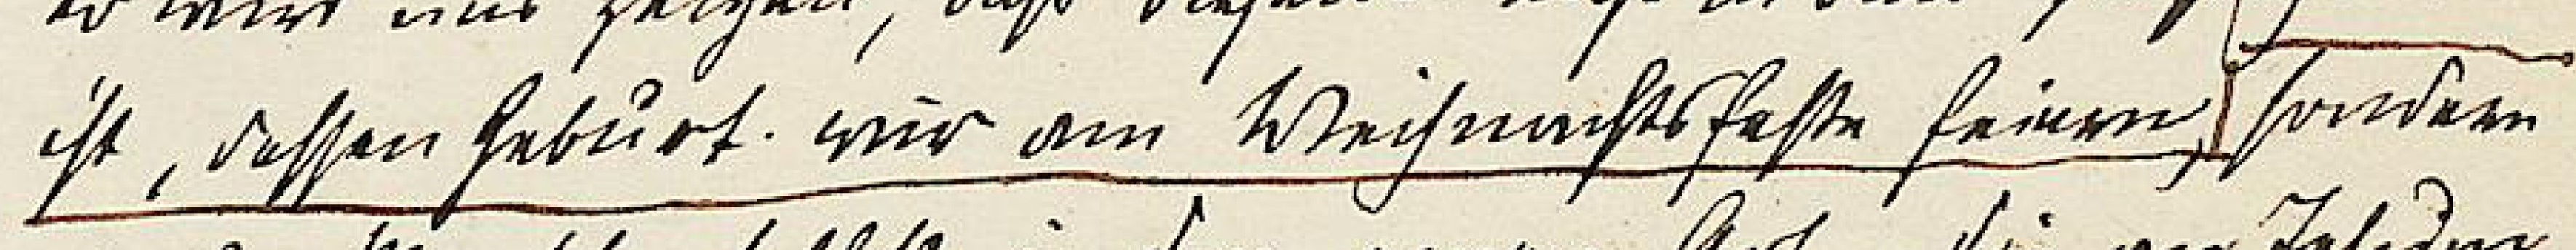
ist, dessen Geburt wir am Weihnachtsfeste feiern, sondern
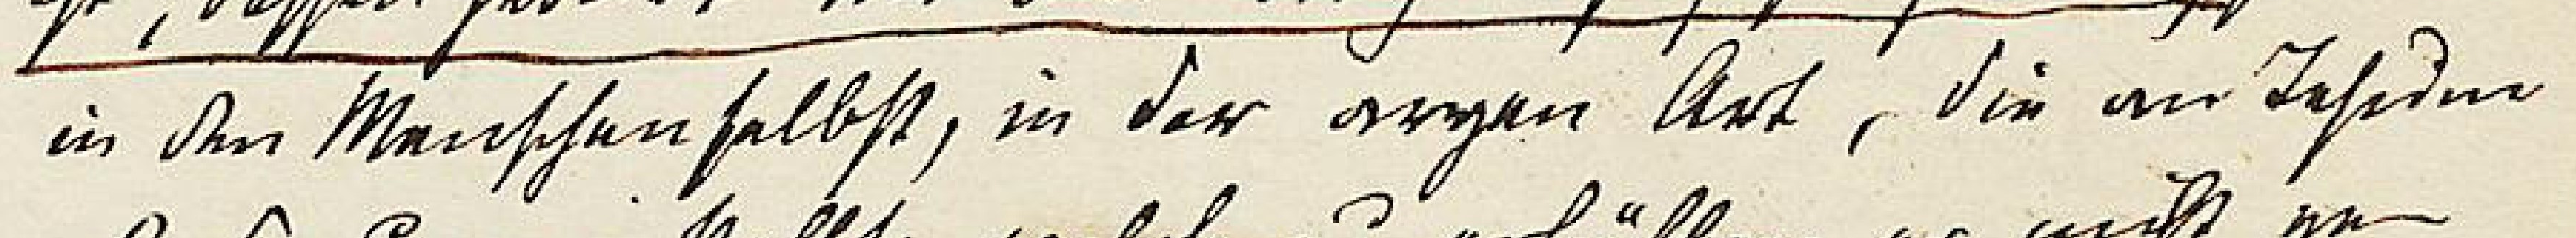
in den Menschen selbst, in der arten Art, die an Jesum
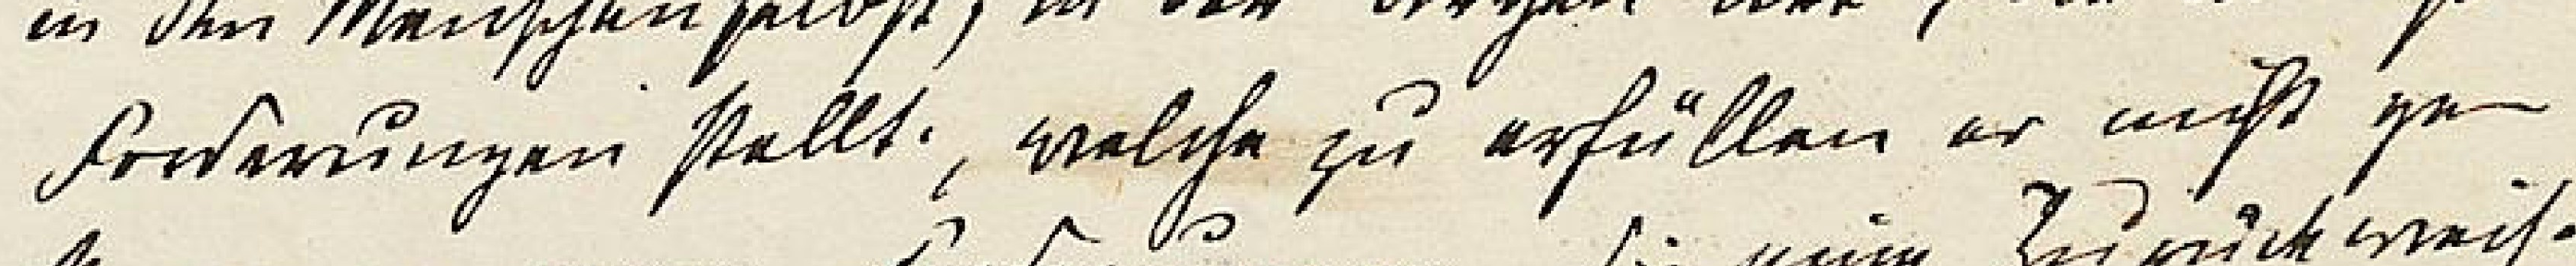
Foderungen stellt, welche zu erfüllen er nicht ge¬
